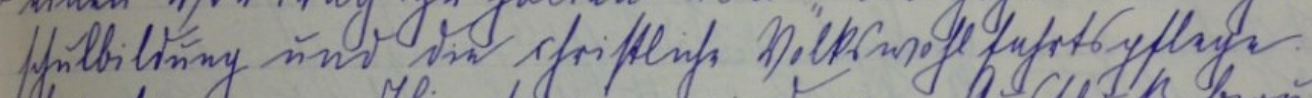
schulbildung und die christliche Volkswohlfahrtspflege".
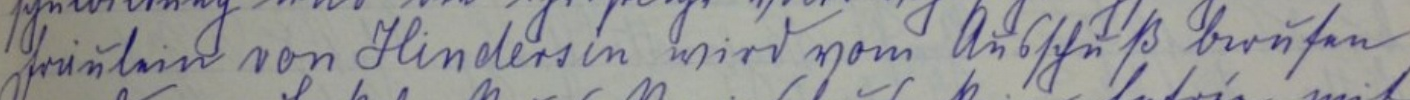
Fräulein von Hindersen wird vom Ausschuß berufen
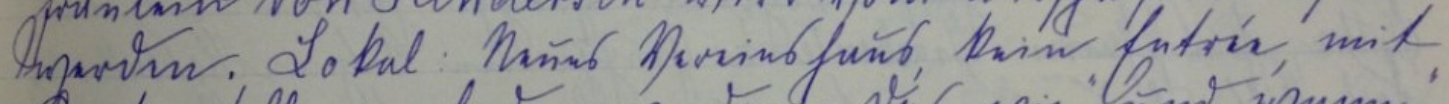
werden. Lokal: Neues Vereinshaus, kein Entrée, mit
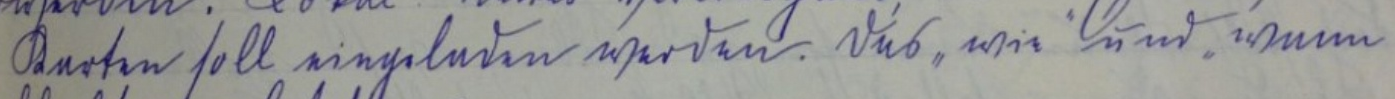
Karten soll eingeladen werden. Das „wie" und „wann"
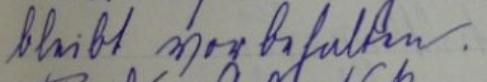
bleibt vorbehalten.
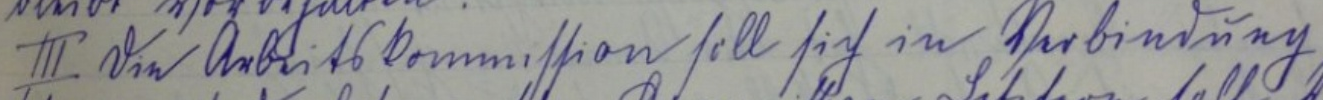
III. Die Arbeitskommission soll sich in Verbindung
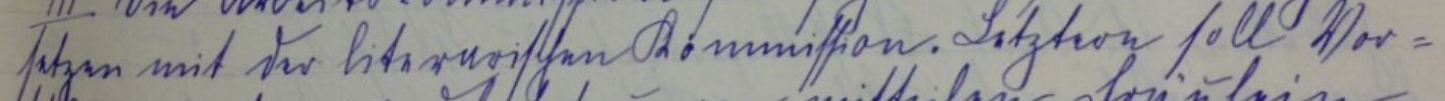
setzen mit der literarischen Komission. Letztere soll Vor-
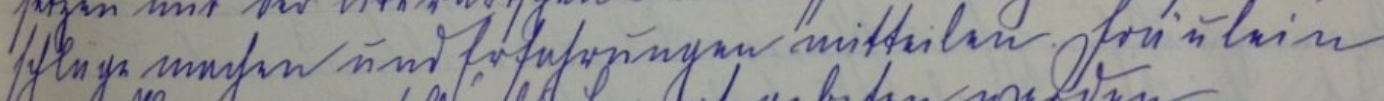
schläge machen und Erfahrungen mitteilen Fräulein
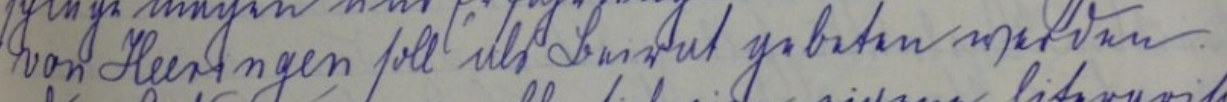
von Heeringen soll als Beirat gebeten werden.
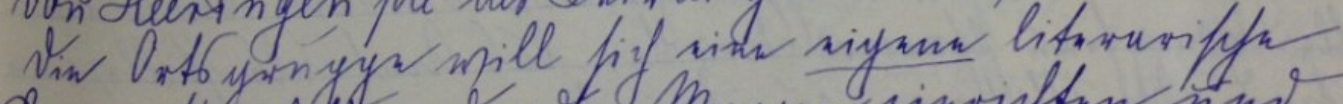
Die Ortsgruppe will sich ein eigene literarische
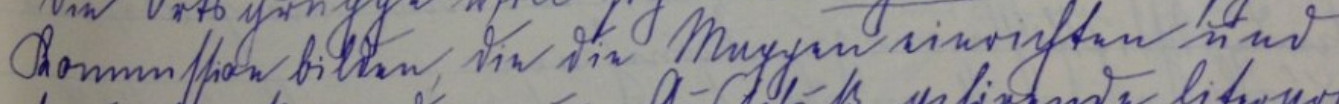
Kommission bilden, die die Mappen einrichten und
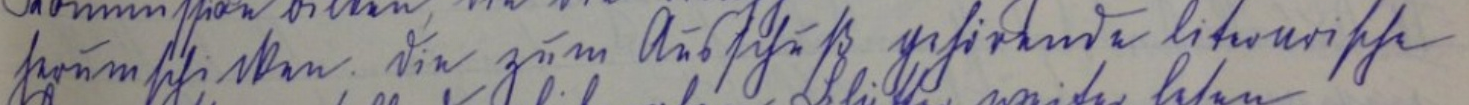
herumschicken. Die zum Ausschuß gehörende literarische
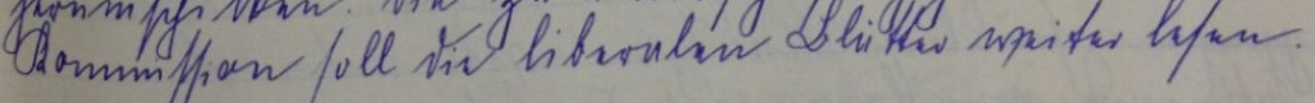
Kommission soll die liberalen Blätter weiter lesen.
